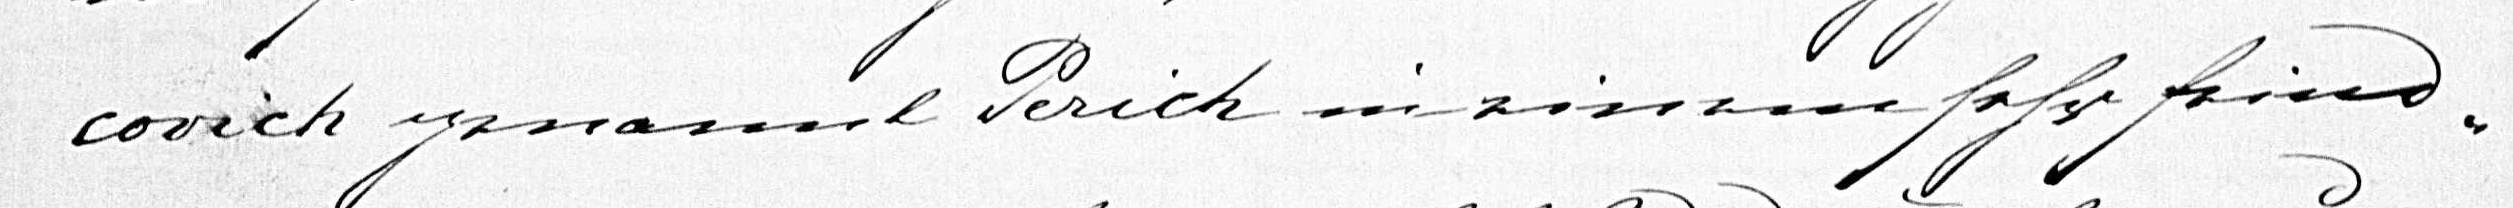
woich genannt Perich in einem sehr feind¬
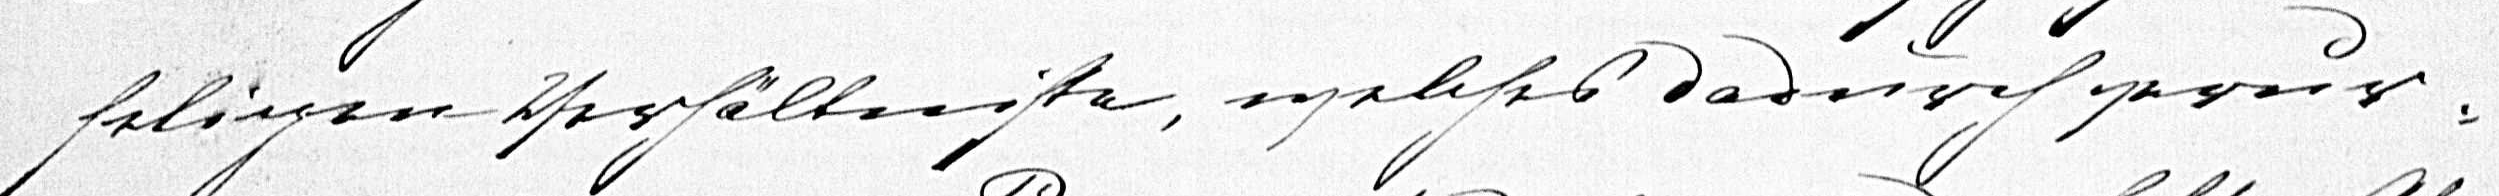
seligen Verhältniße, welches dadurch verur¬
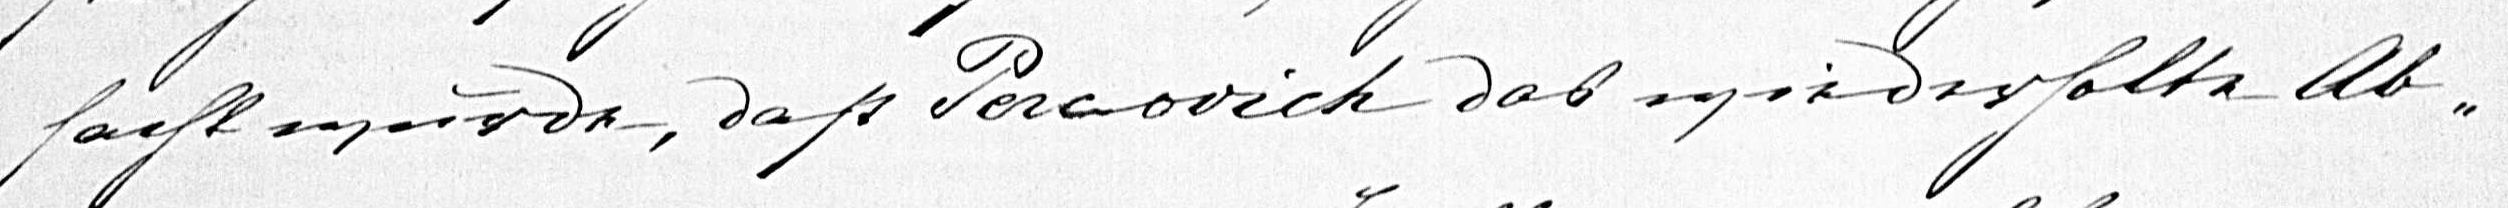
sacht wurde, daß Percovich das wiederholte Ab¬
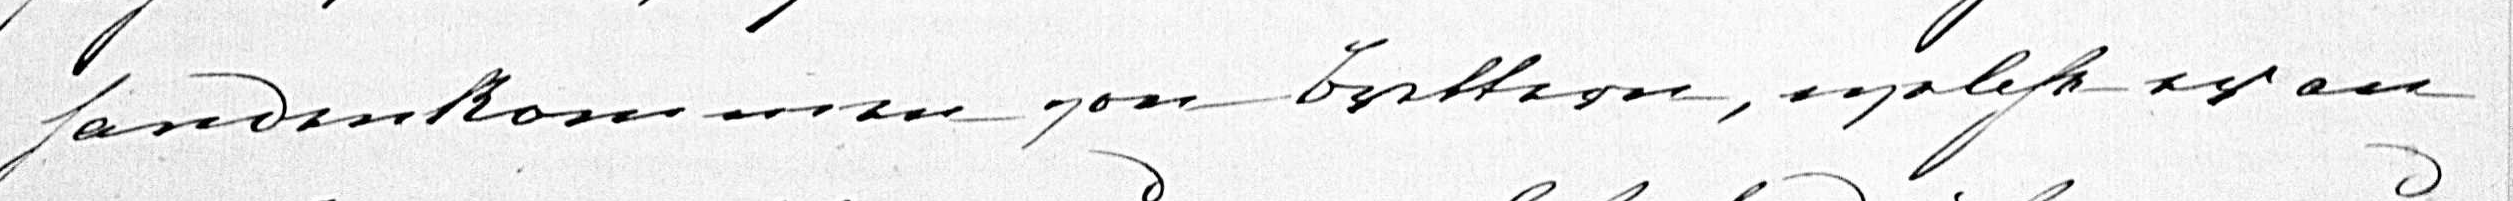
handenkommen von Brettern, welche er an
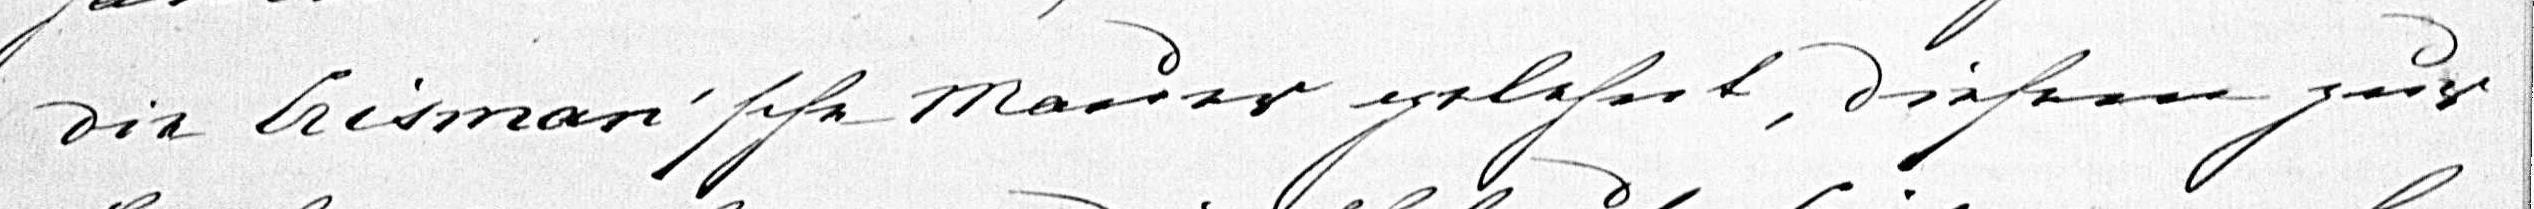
die Crisman'sche Mauer gelehnt, diesem zur
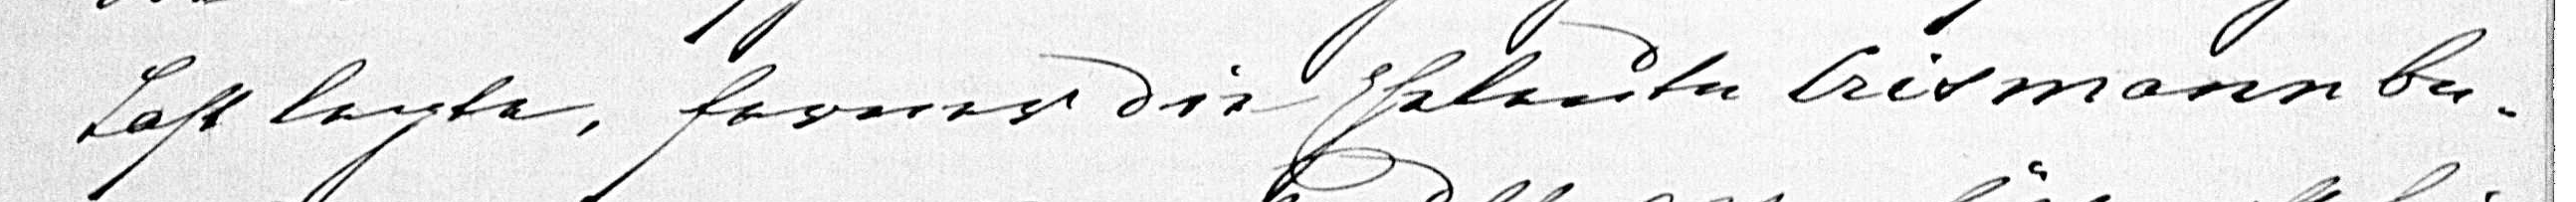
Last legte, ferner die Eheleute Crismann be¬
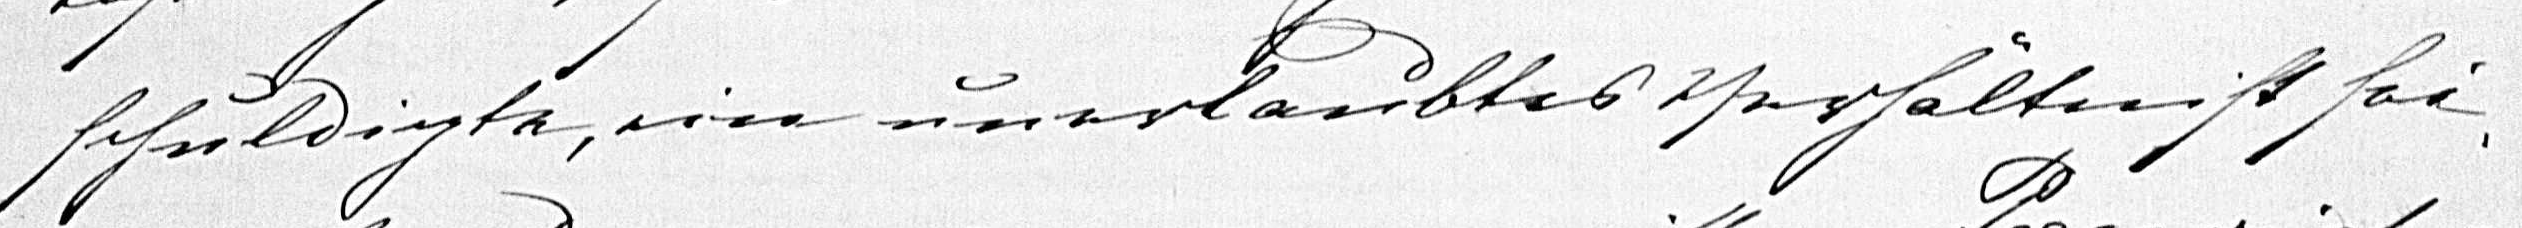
schuldigte, ein unerlaubtes Verhältniß sei¬
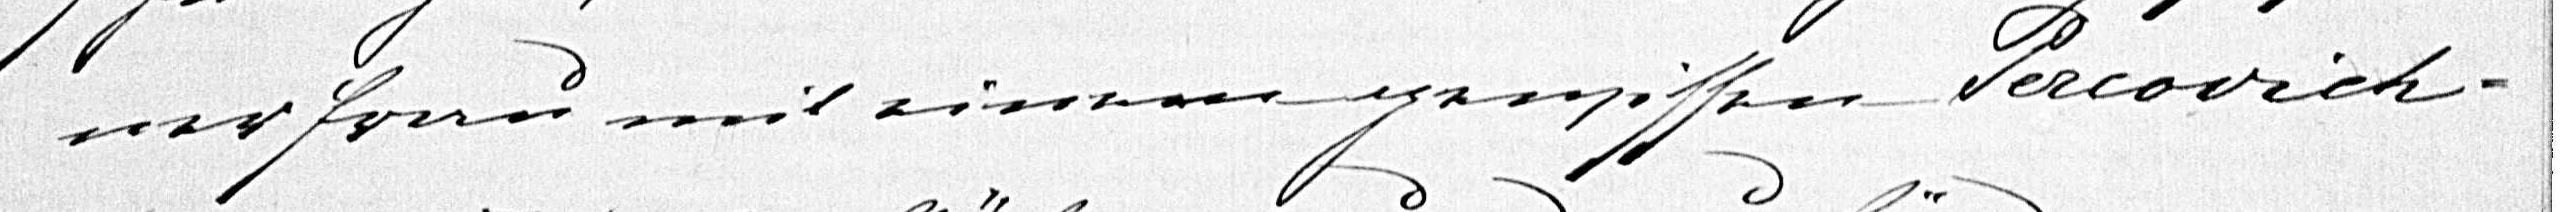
ner Frau mit einem gewissen Percovich-
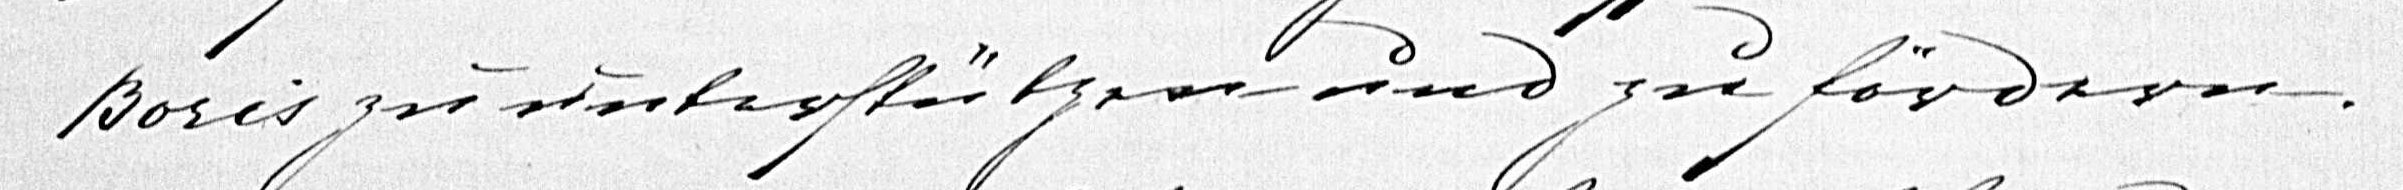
Boris zu unterstützen und zu fördern.
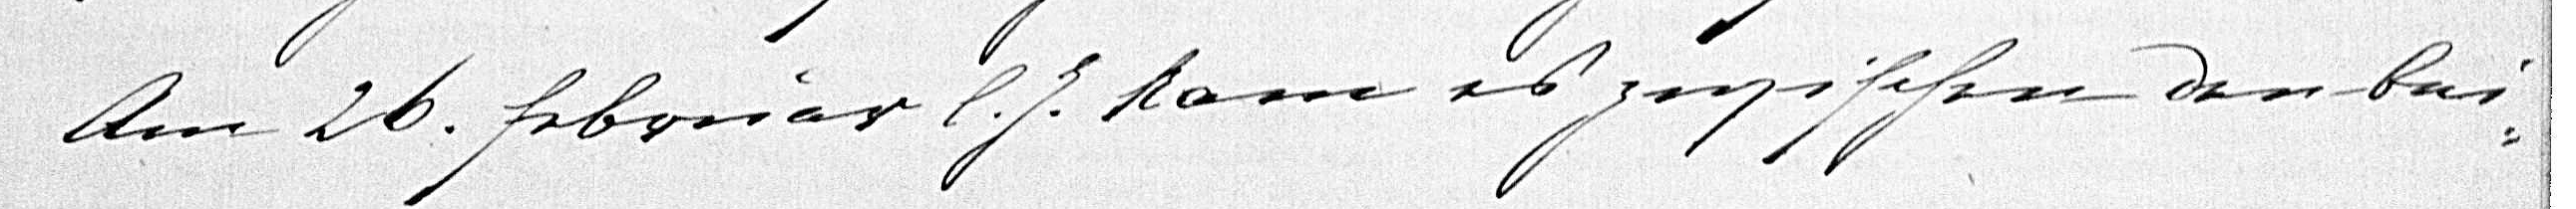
Am 26. februar l. J. kam es zwischen den bei¬
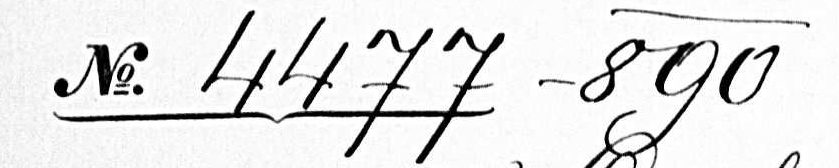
No. 4477 - 890
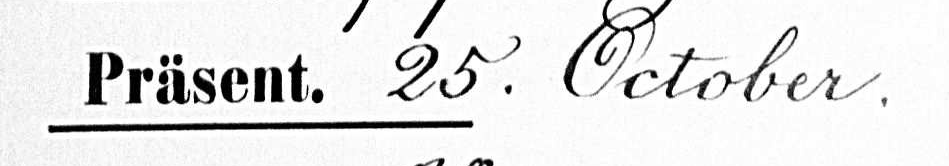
Präsent. 25.October.
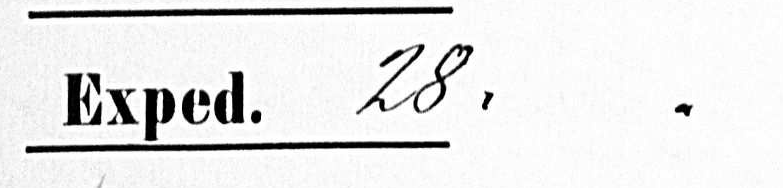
Exped. 28. October.
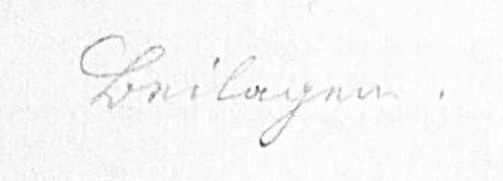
Beilagen.
